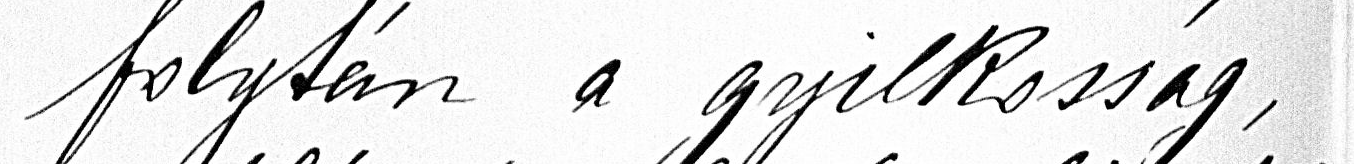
folytán a gyilkosság,
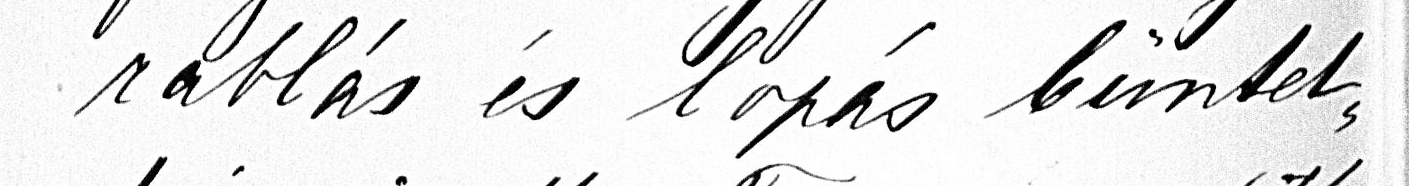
rablás és lopás büntet¬
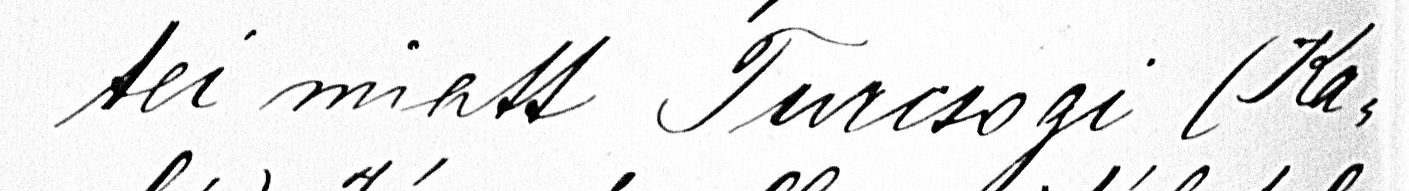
tei mihtt Turcsozi (Ka¬
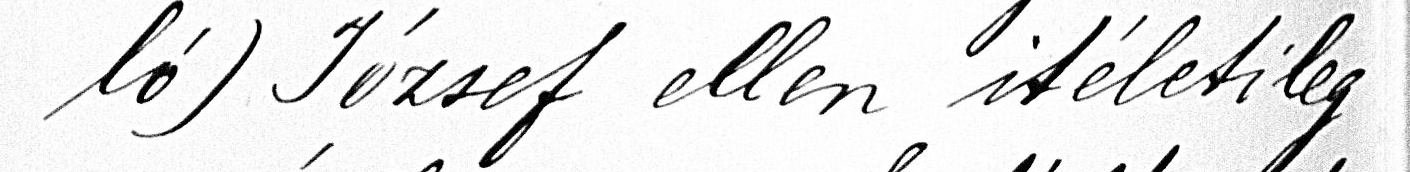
ló) József ellen itéletileg
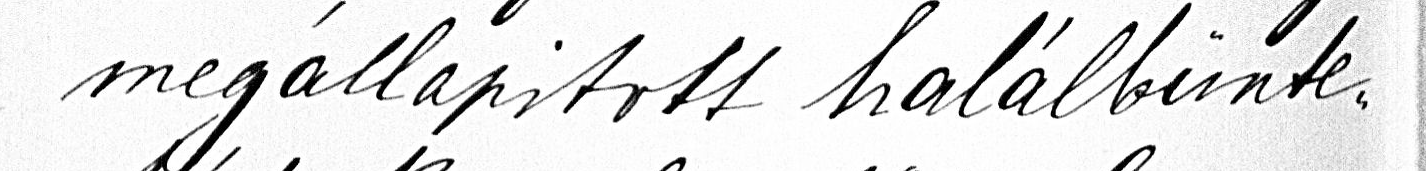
megállapitott halálbünte¬
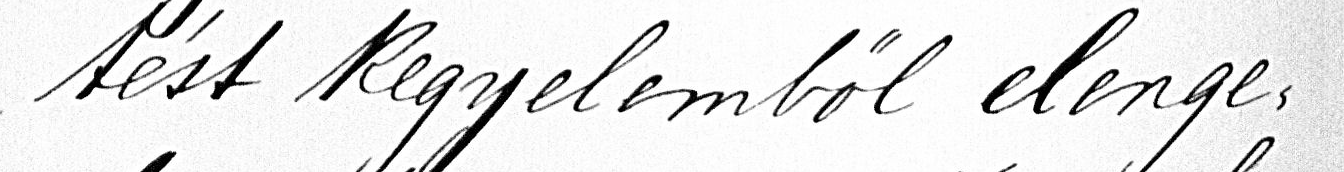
tést Regyelemböl elenge¬
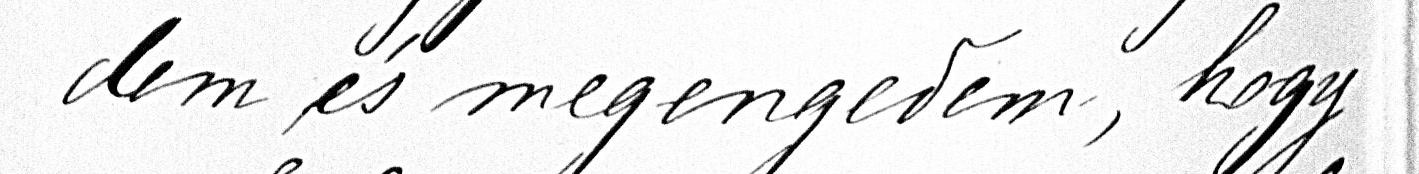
dem és megengedem, hogy
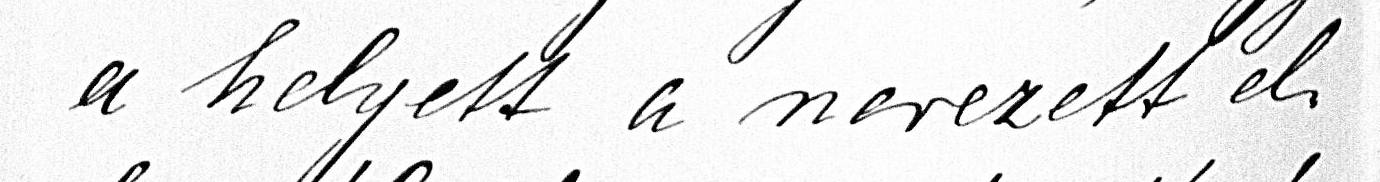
a helyett a nerezett el¬
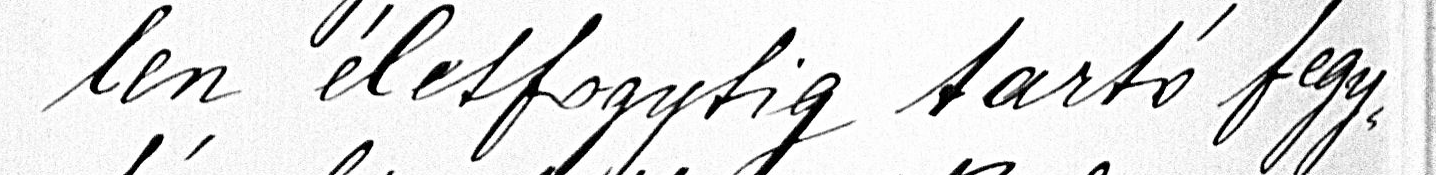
len életfozytig tartó fegy¬
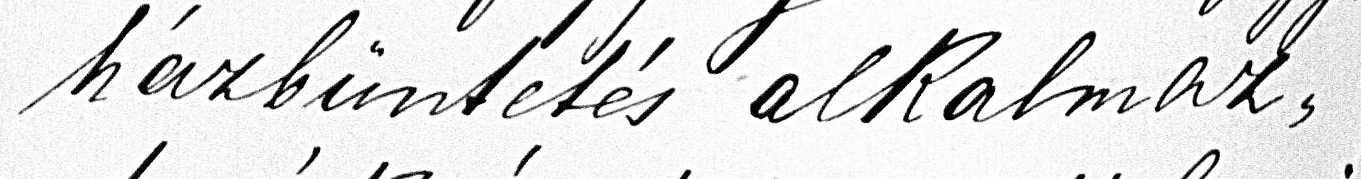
házbüntetés alkalmaz¬
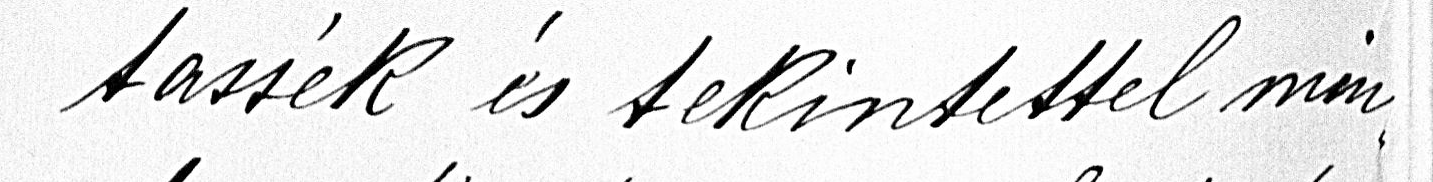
tassék és tekintettel min¬
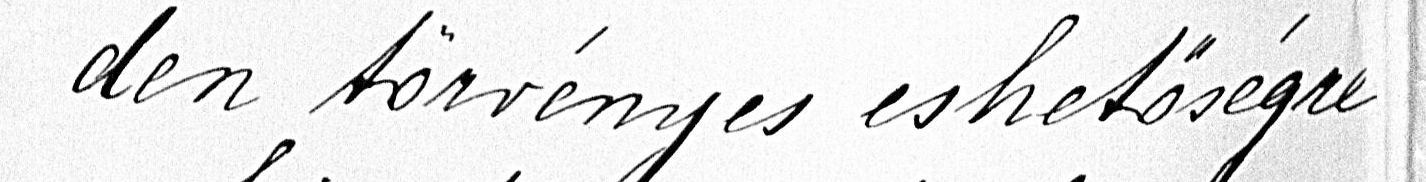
den törvényes eshetöségre
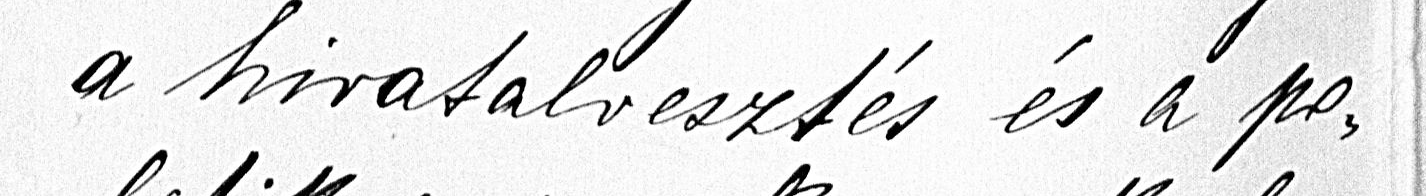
a hiratalvesztés és a pe¬
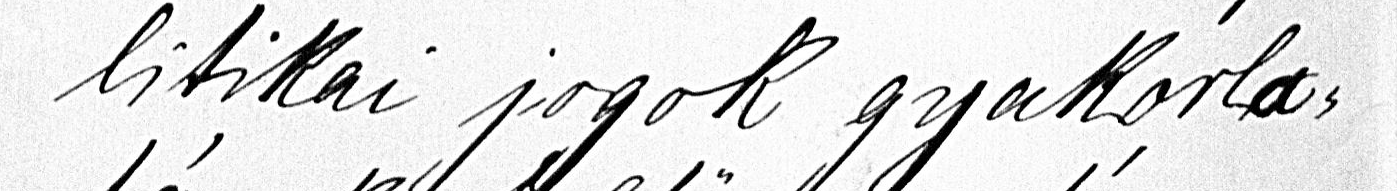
litikai jogok gyakorla¬
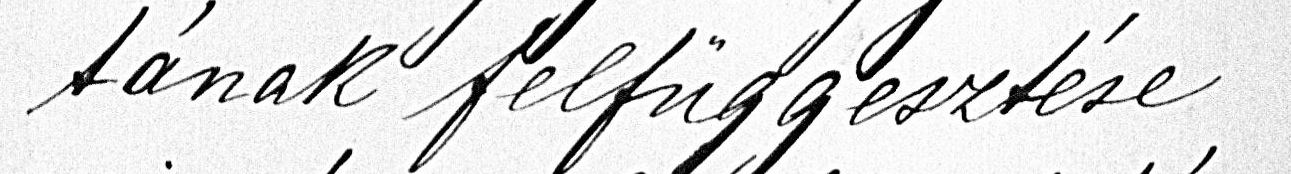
tának felfüggesztése
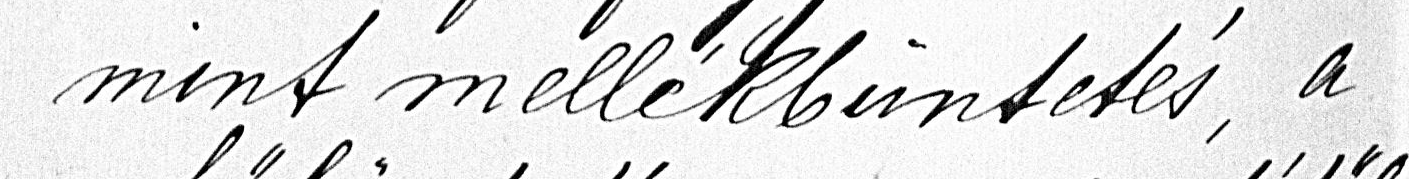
mint mellékbüntetés, a
